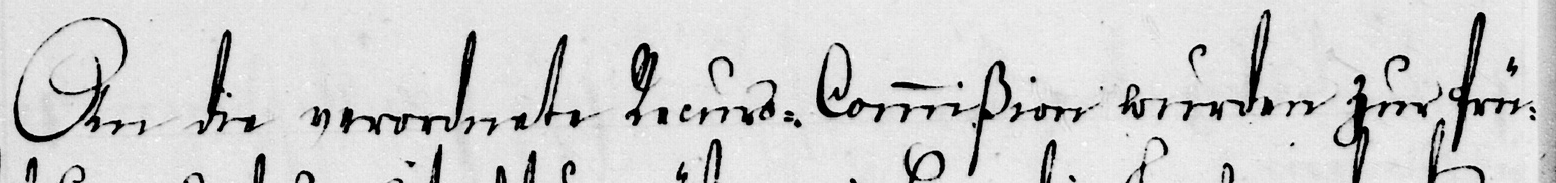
An die verordnete Recurs-Commißion wurden zur Prü¬
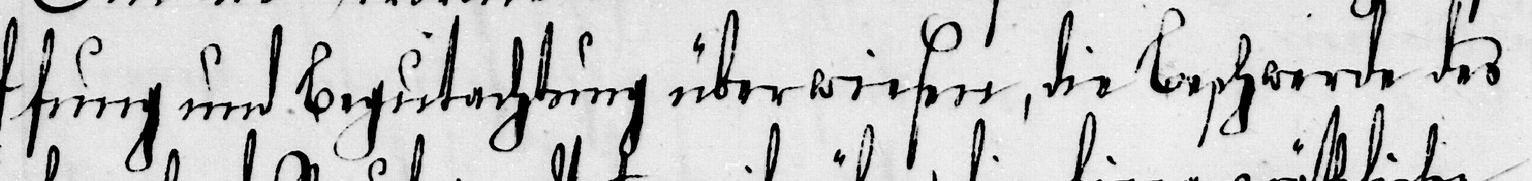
fung und Begutachtung überwiesen, die Beschwerde des
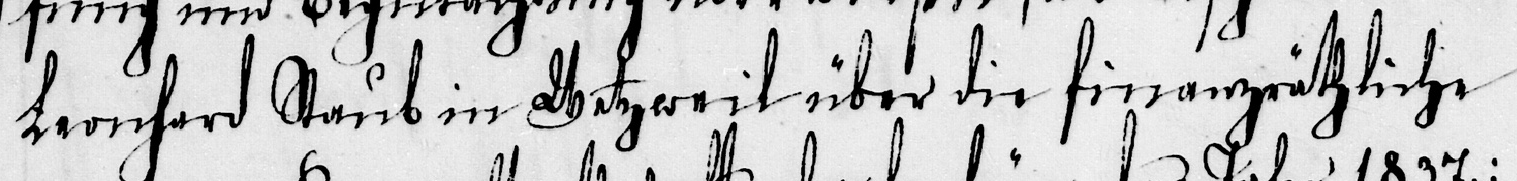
Leonhard Staub in Wetzwil über die finanzräthliche
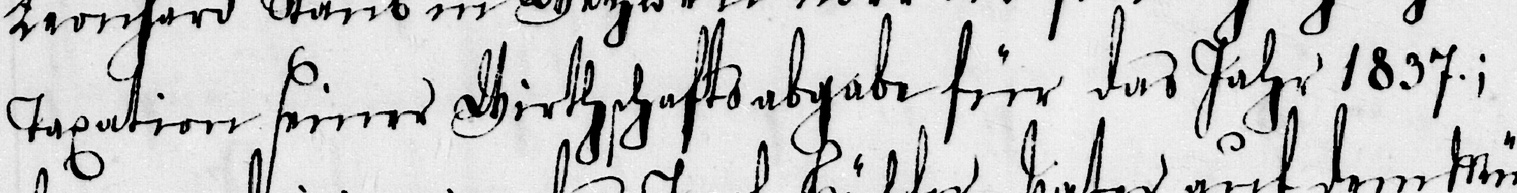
Taxation seiner Wirthschaftsabgabe für das Jahr 1837.;
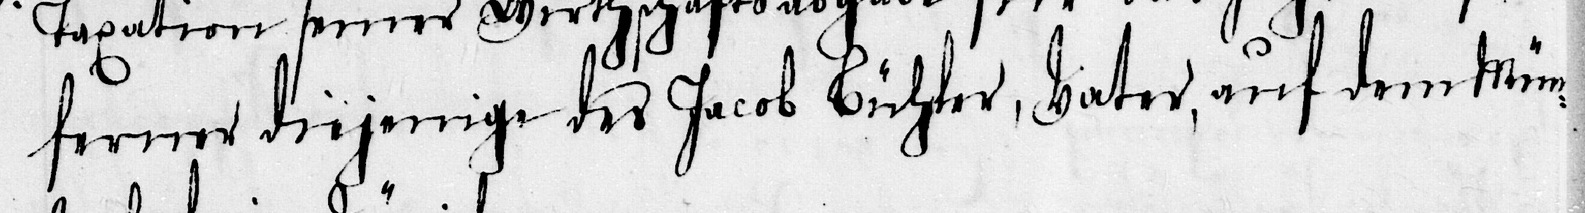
fernen diejenige des Jacob Bühler, Vater, auf dem Mün¬
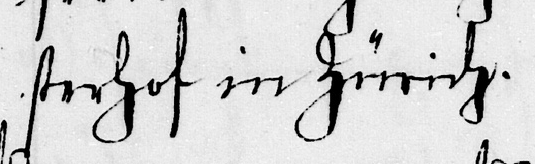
sterhof in Zürich.
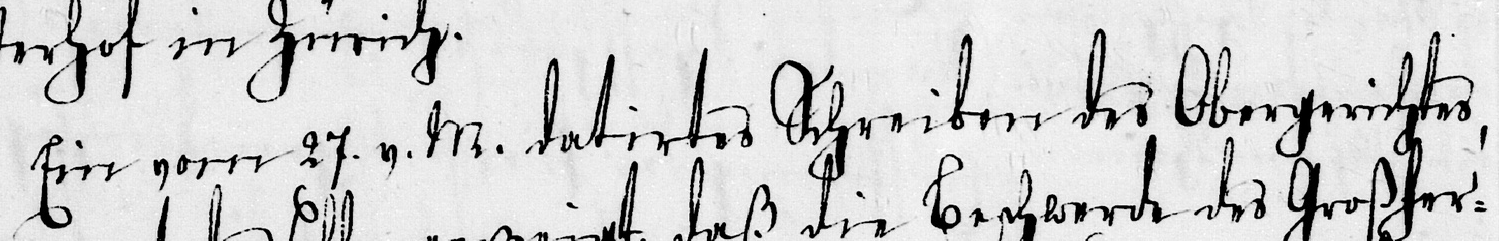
Ein vom 27. v. M. datirtes Schreiben des Obergerichtes,
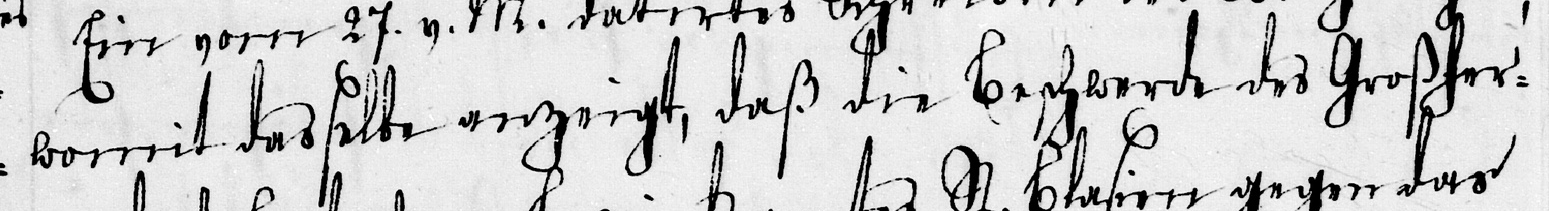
womit dasselbe anzeigt, daß die Beschwerde des Großher¬
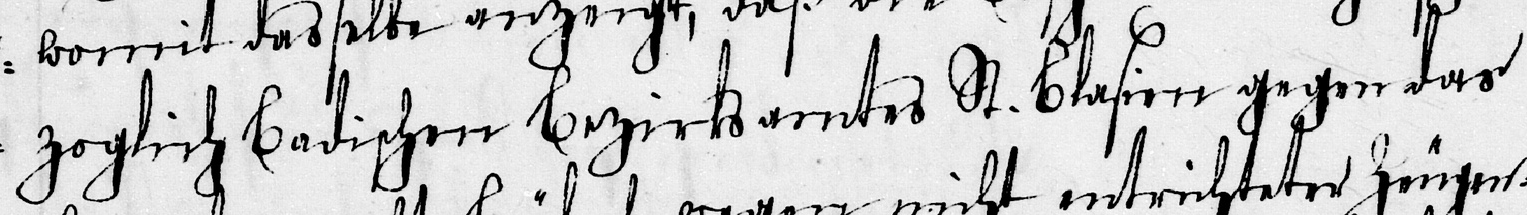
zoglich Badischen Bezirksamtes St. Blasien gegen das
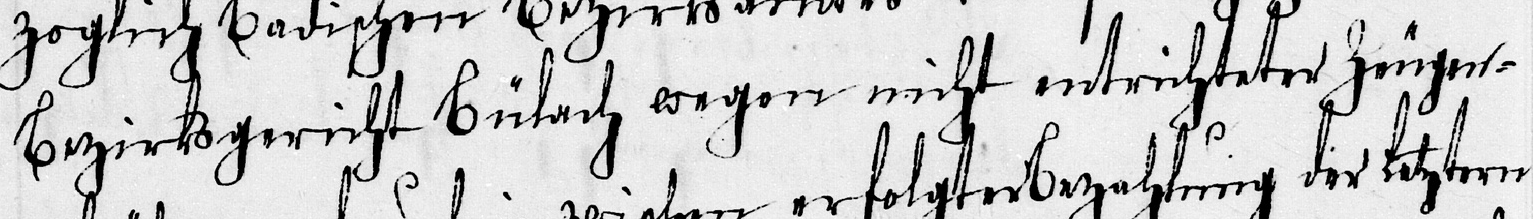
Bezirksgericht Bülach wegon nicht entrichteter Zeugen¬
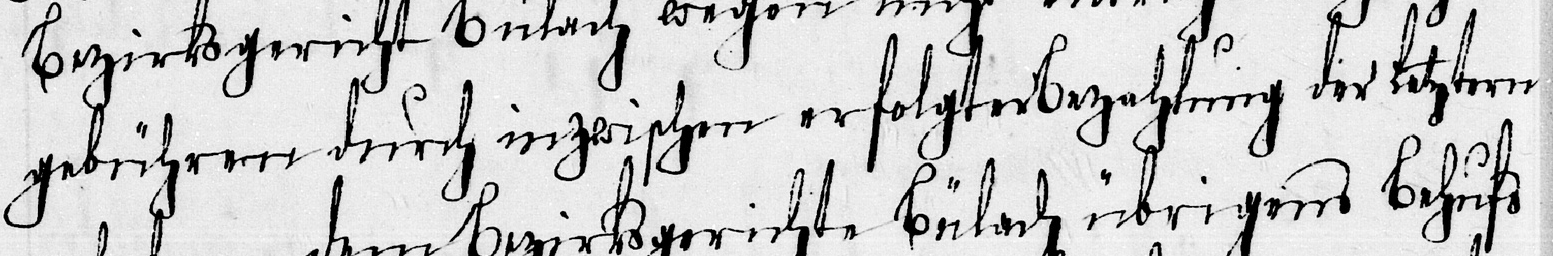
gebühren durch inzwischen erfolgter Bezahlung der letztern
